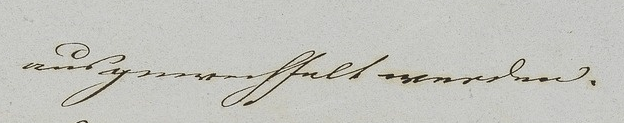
ausgewechselt werden.
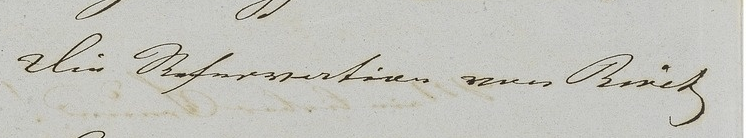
Die Reservation von Rivet
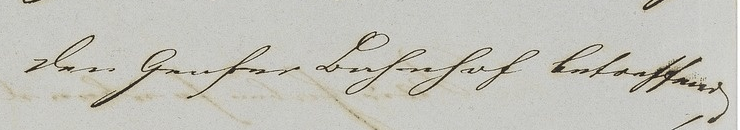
den Genfer Bahnhof betreffend,
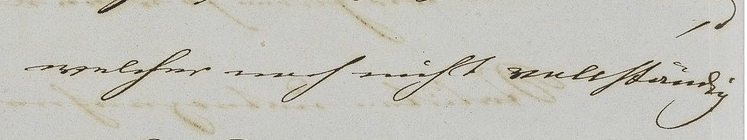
welcher noch nicht vollständig
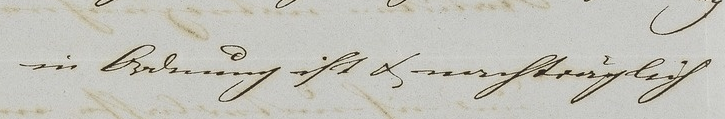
in Ordnung ist & nachträglich
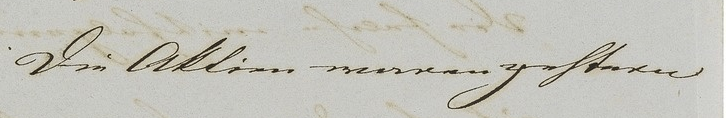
Die Aktien waren gestern
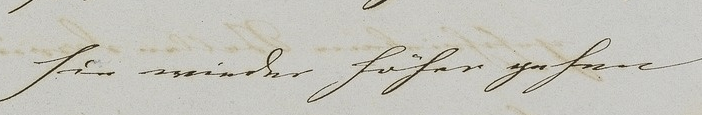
sie wieder höher gehen
